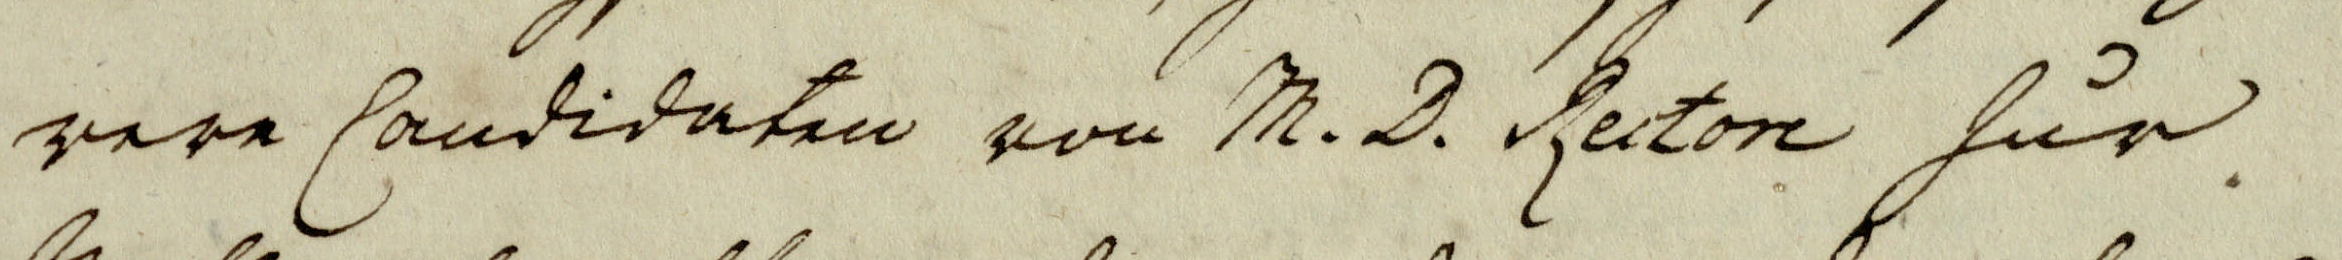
rere Candidaten von M. D. Rectore zur
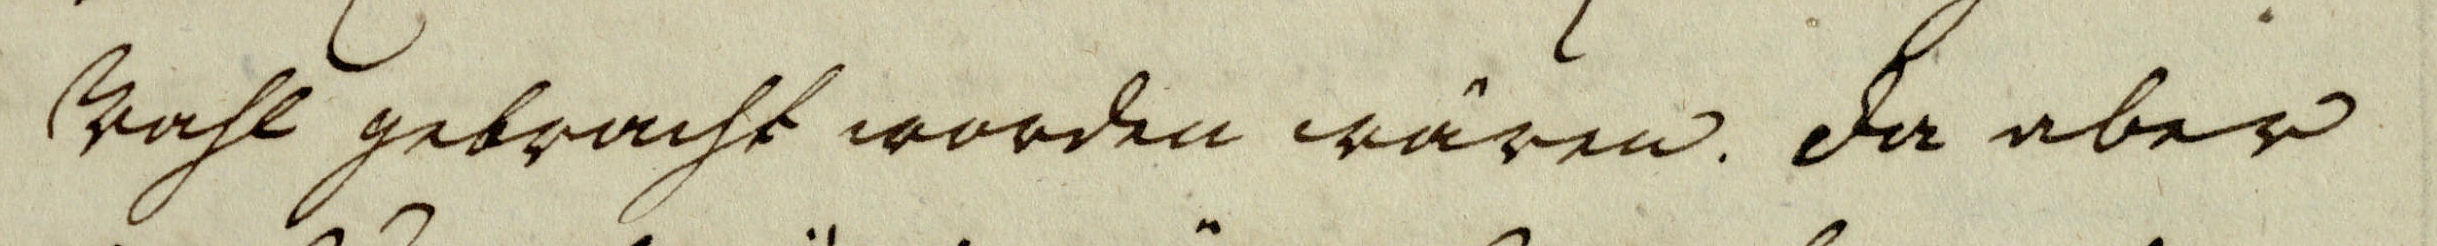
Wahl gebracht worden wären. Da aber
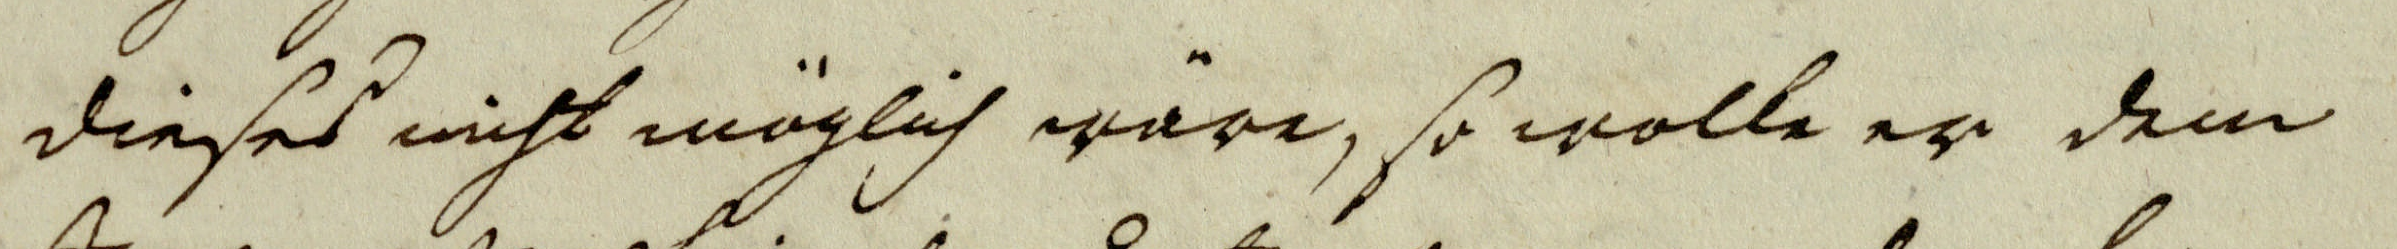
dieses nicht möglich wäre, so wolle er dem
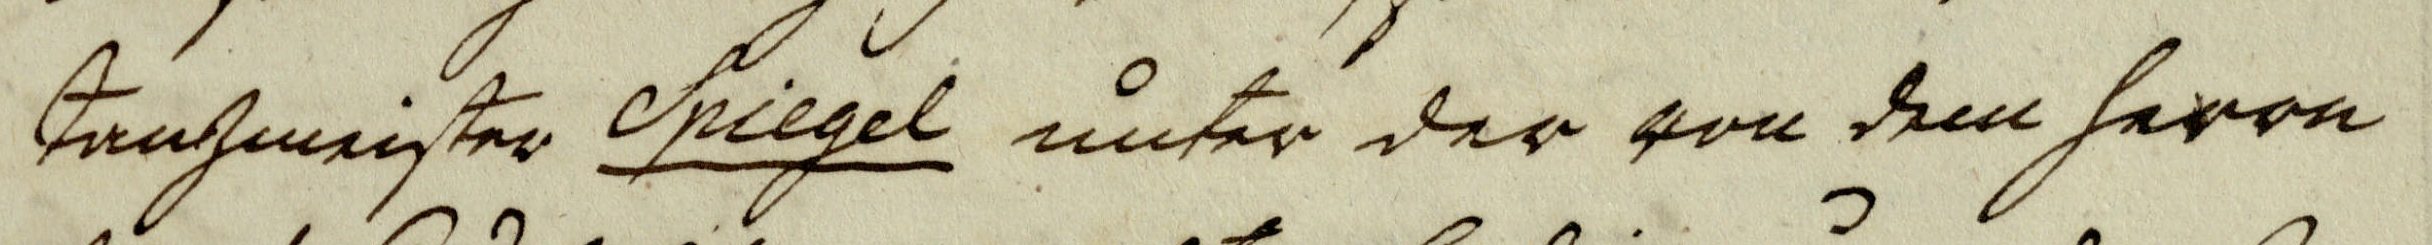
Tanzmeister Spiegel unter der von dem Herrn
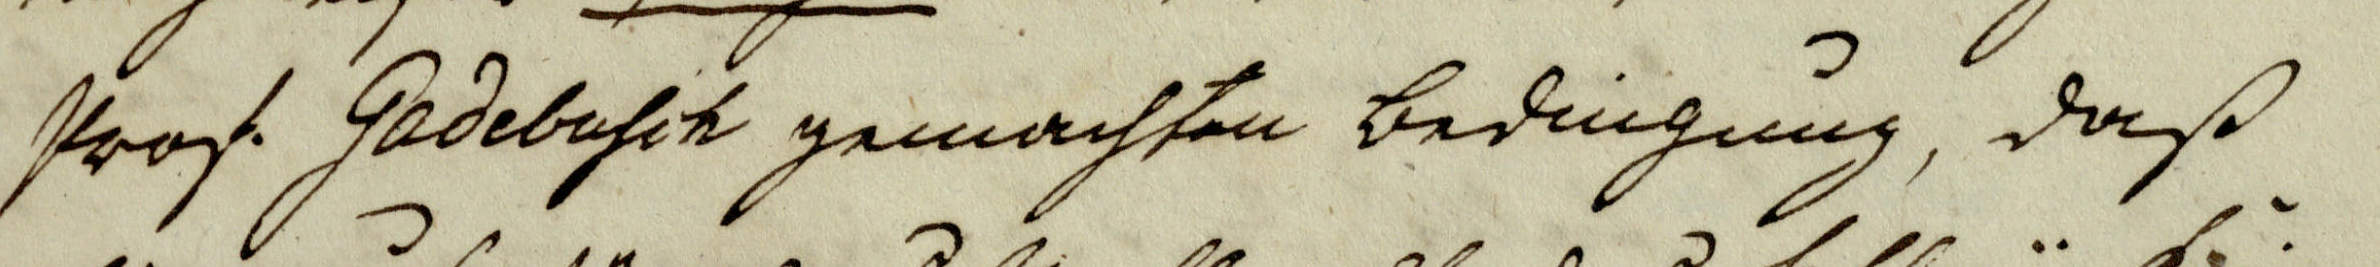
Prof. Gadebusch gemachten Bedingung, daß
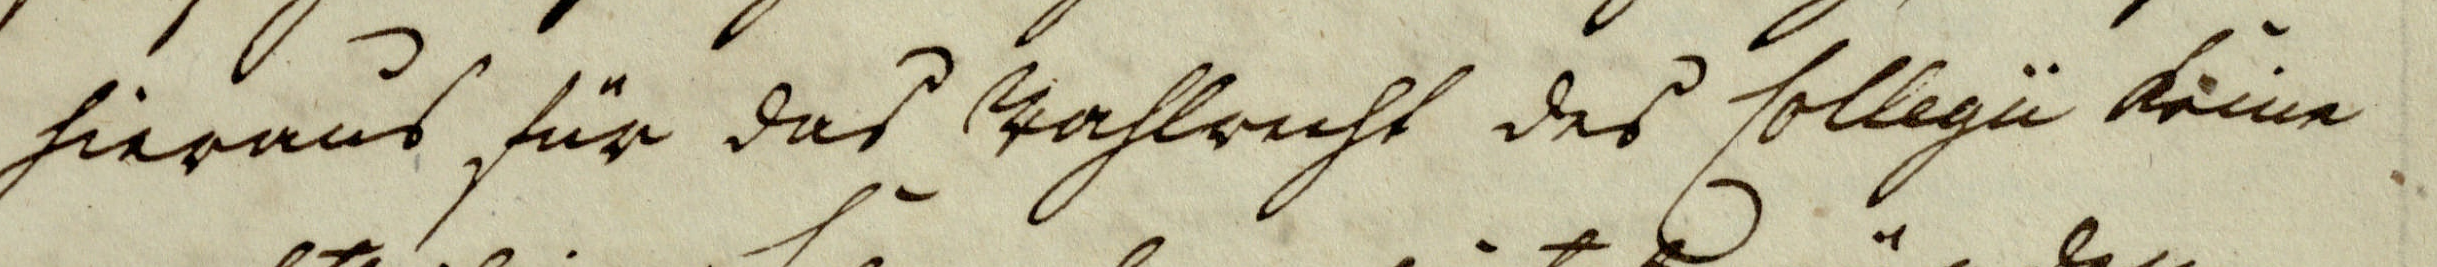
hieraus für das Wahlrecht des Collegii keine
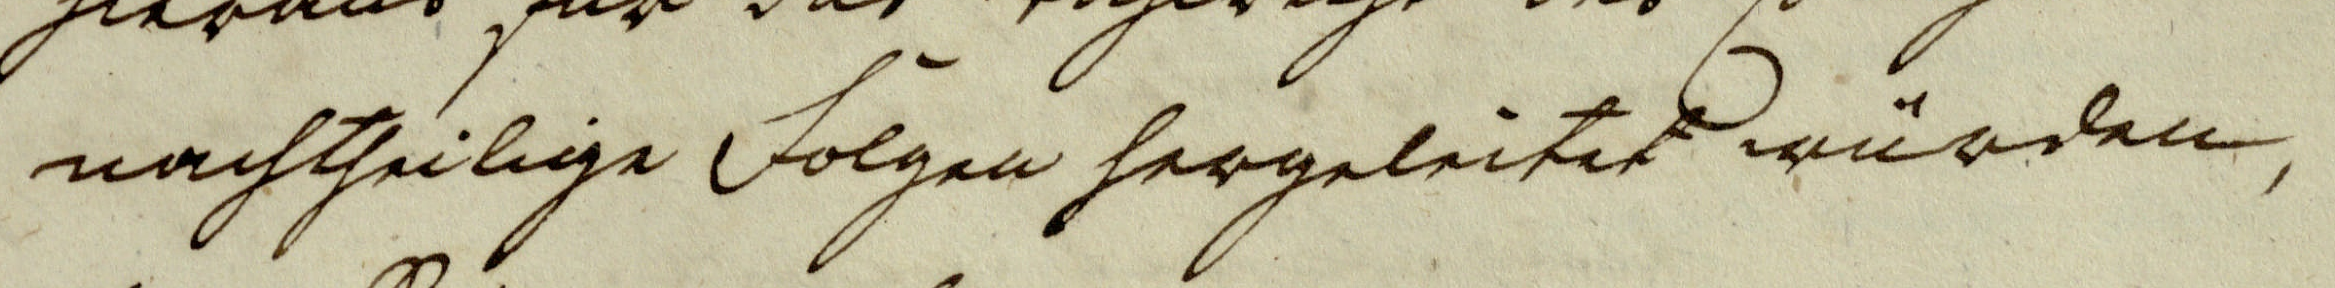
nachtheilige Folgen hergeleitet würden,
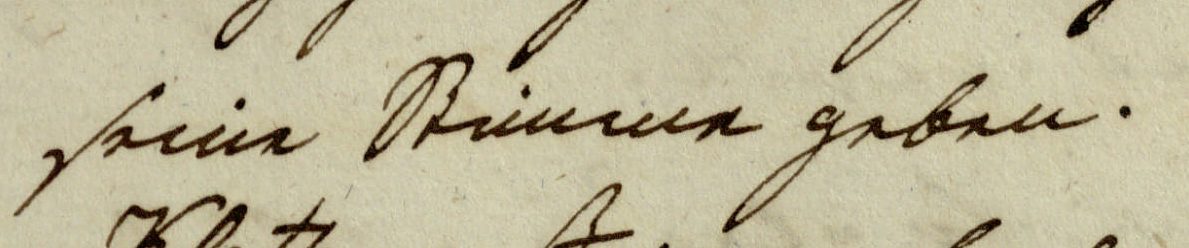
seine Stimme geben.
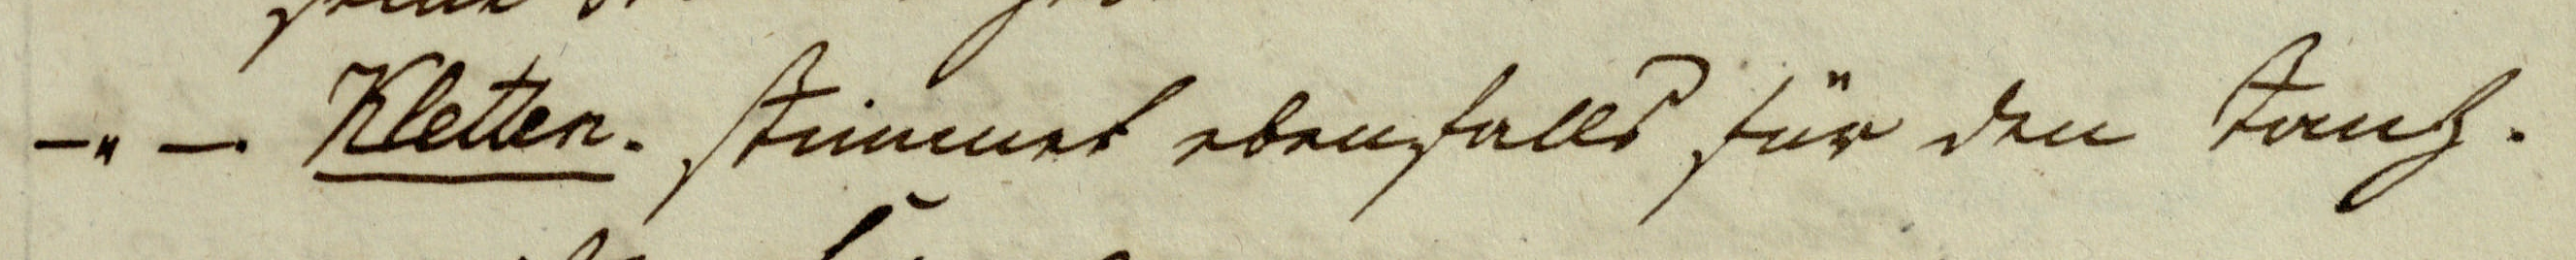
Kletten. stimmet ebenfalls für den Tanz¬
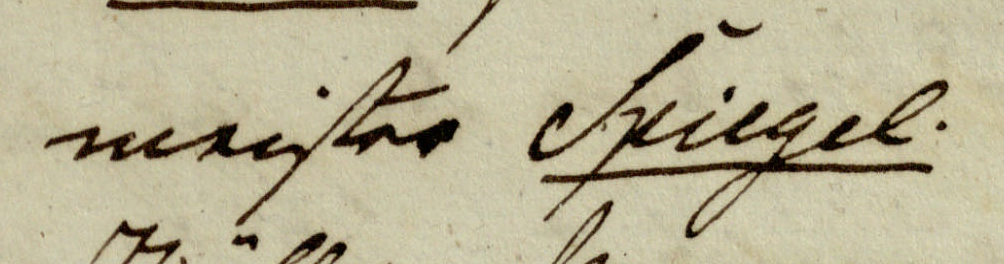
meister Spiegel.
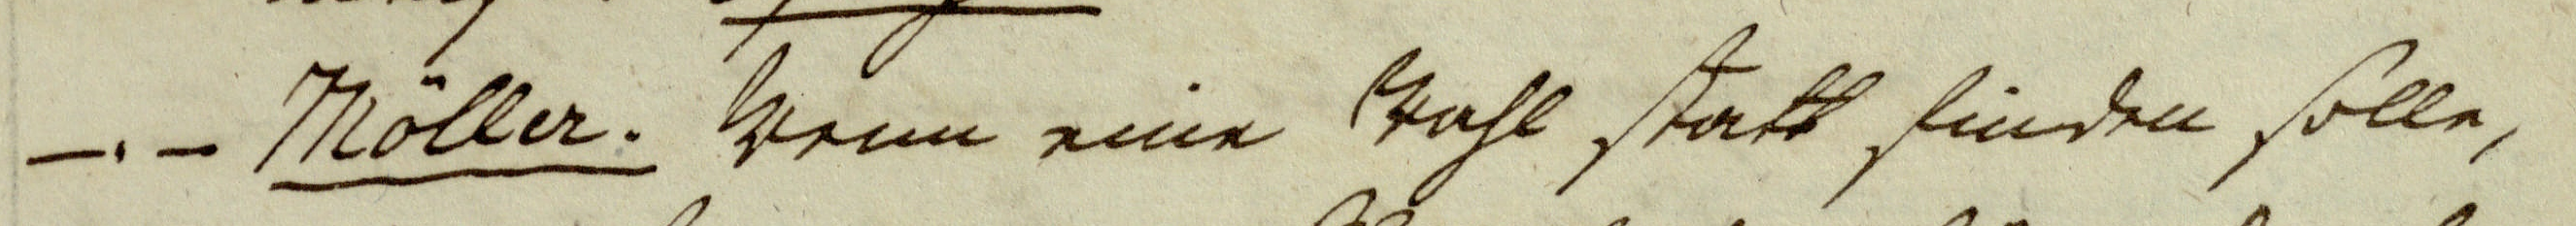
Möller. Wenn eine Wall statt finden solle,
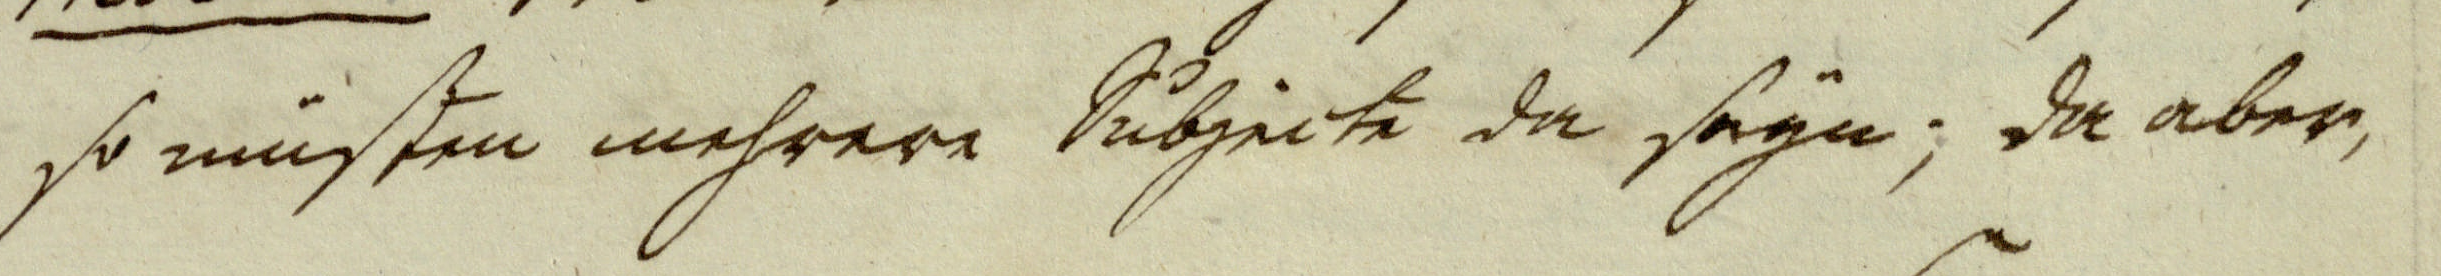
so müßten mehrere Subjecte da seÿn; da aber,
